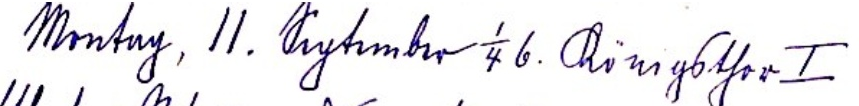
Montag 11. September ¼ 6 Königsthor I
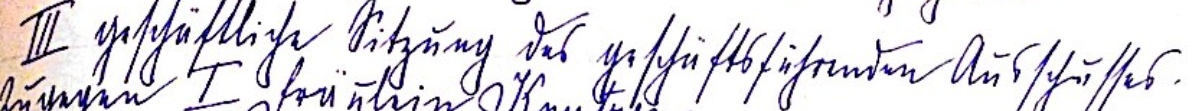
III. geschäftliche Sitzung des geschäftsführenden Ausschusses
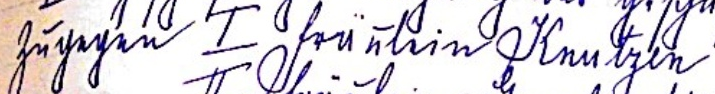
Zugegen: I Fräulein Knutzen
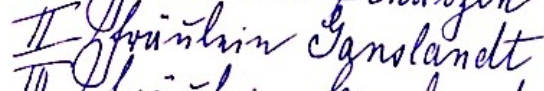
II Fräulein Ganslandt
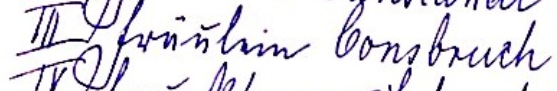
III Fräulein Consbruck
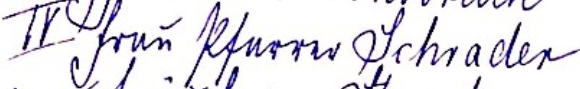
IV Frau Pfarrer Schrader
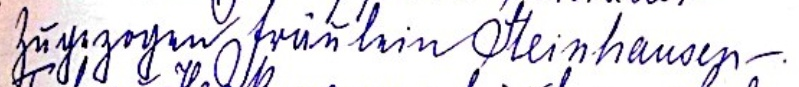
Zugezogen Fräulein Steinhausen
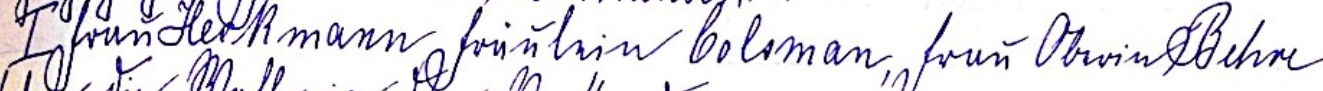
I. Frau Herkmann, Fräulein Colsman, Frau Oberin Behre
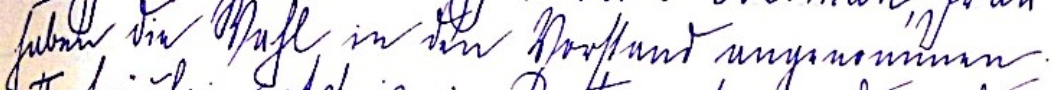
haben die Wahl in den Vorstand angenommen
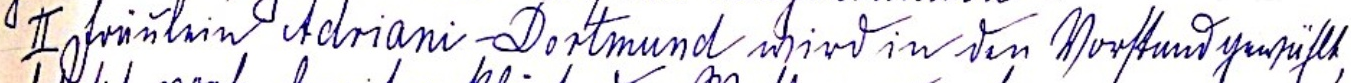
II. Fräulein Adrian . Dortmund wird in den Vorstand gewählt
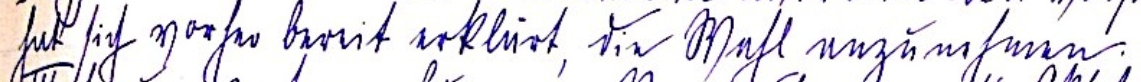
hat sich vorher bereit erklärt, die Wahl anzunehmen.
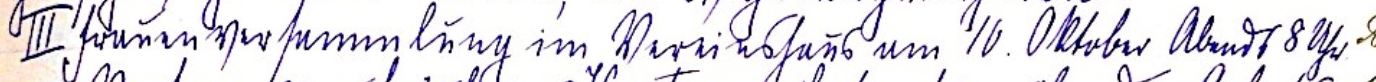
III. Frauenversammlung im Neuen Vereinshaus am 10 Oktober Abends 8 Uhr.
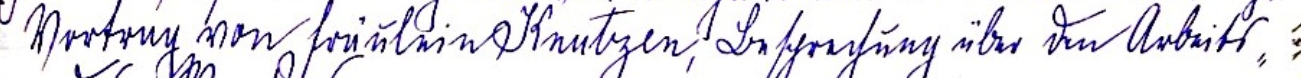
Vortrag von Fräulein Kuntzen, Besprechung über den Arbeits
